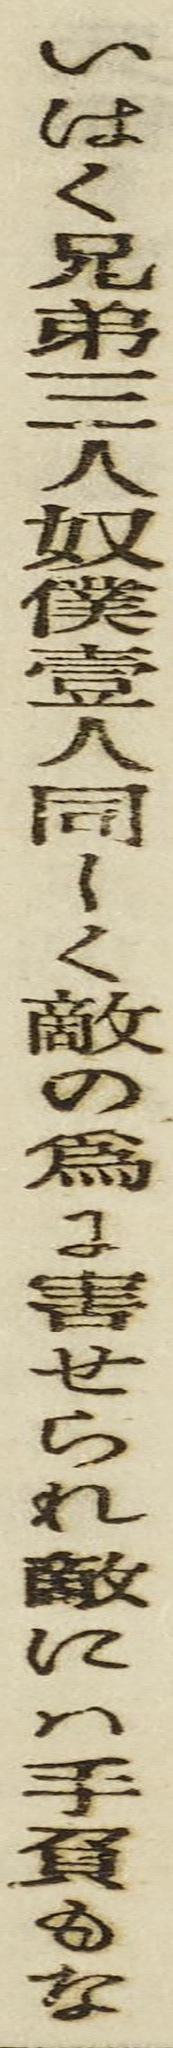いはく兄弟三人奴僕壹人同しく敵の為に害せられ敵にハ手負もな
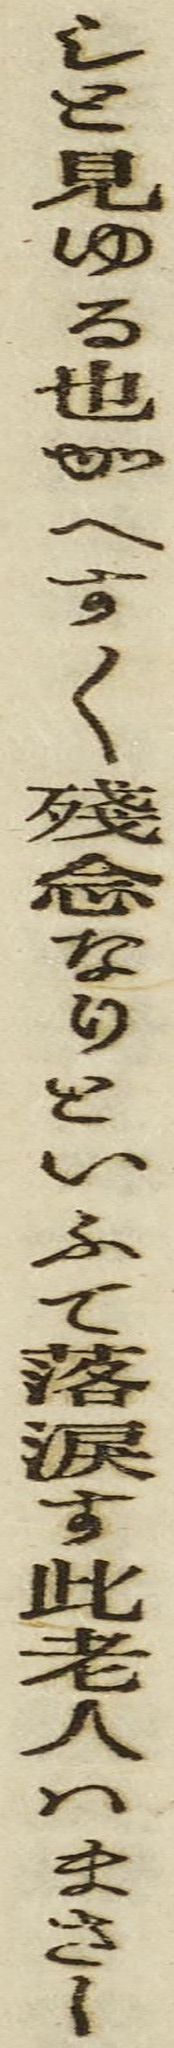しと見ゆる也かへす〳〵残念なりといふて落涙す此老人ハまさし

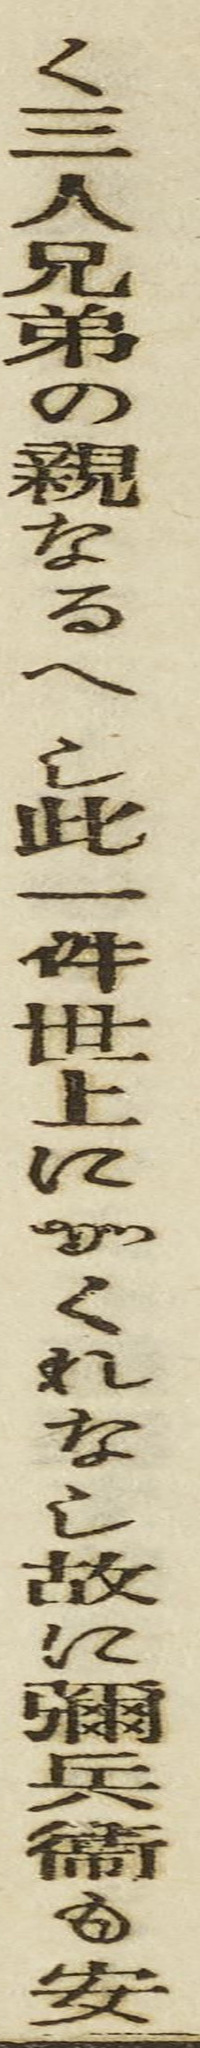く三人兄弟の親なるへし此一件世上にかくれなし故に弥兵衛も安
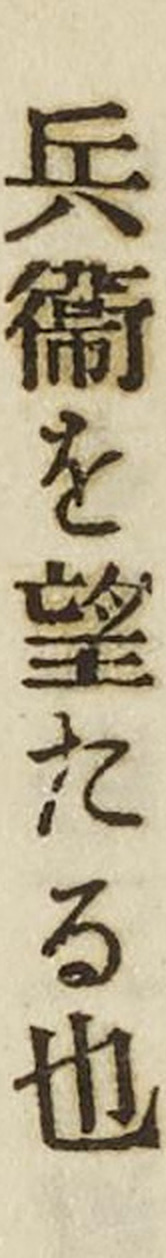兵衛を望たる也
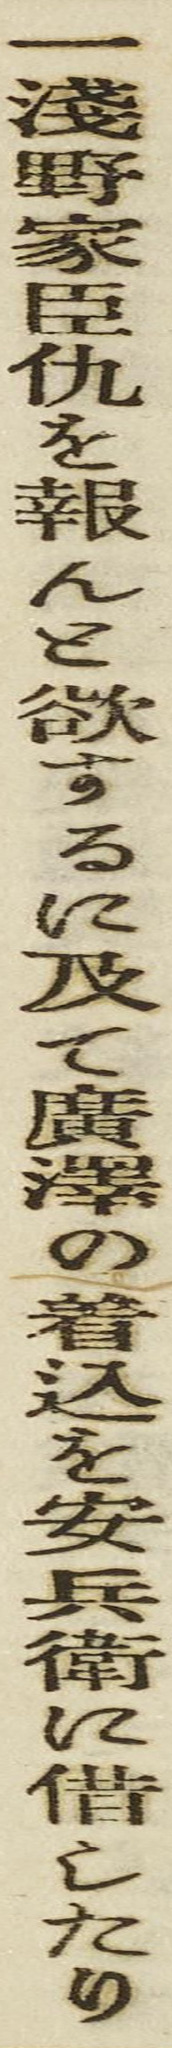一浅野家臣仇を報んと欲するに及て広沢の着込を安兵衛に借したり
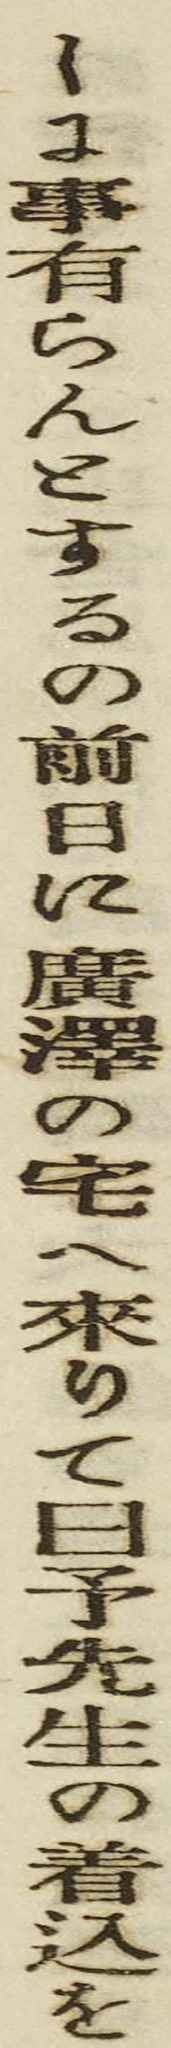しに事有らんとするの前日に広沢の宅へ来りて曰予先生の着込を
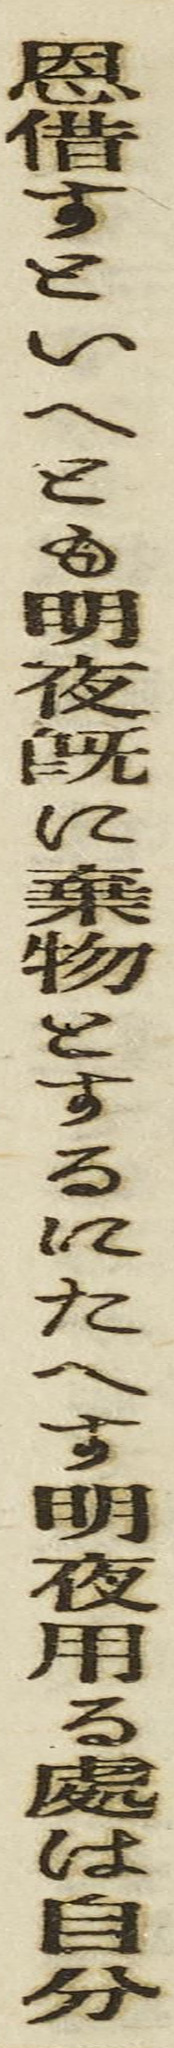恩借すといへとも明夜既に棄物とするにたへす明夜用る処は自分
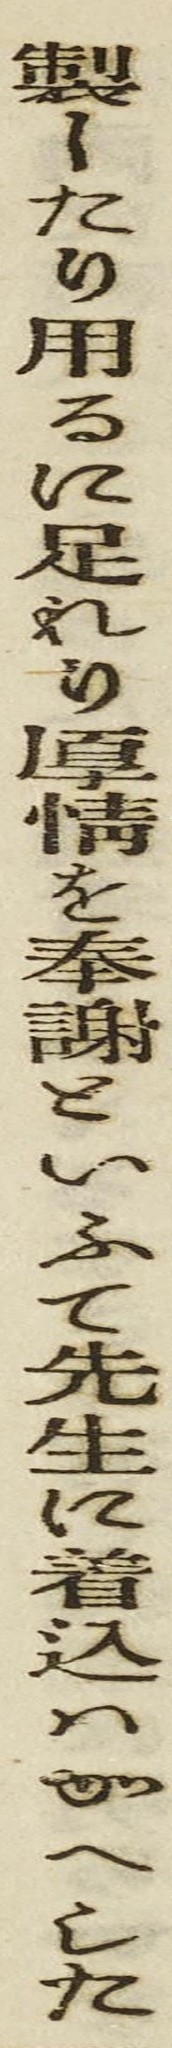製したり用るに足れり厚情を奉謝といふて先生に着込ハかへした
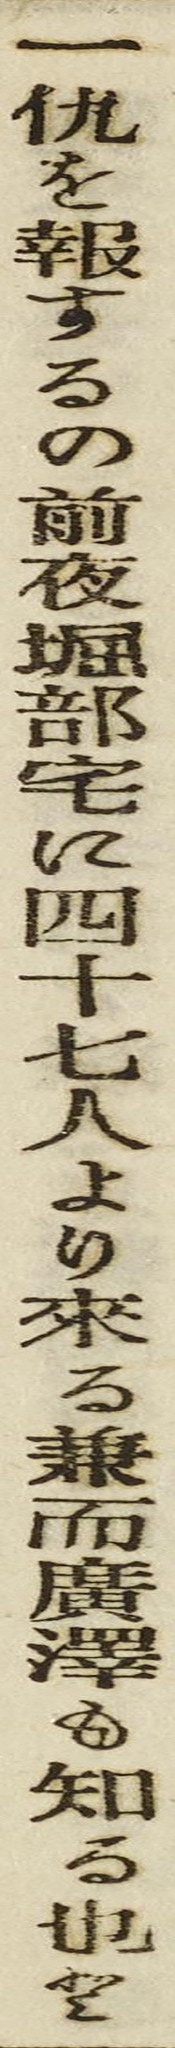一仇を報するの前夜堀部宅に四十七人より来る兼而広沢も知る也と
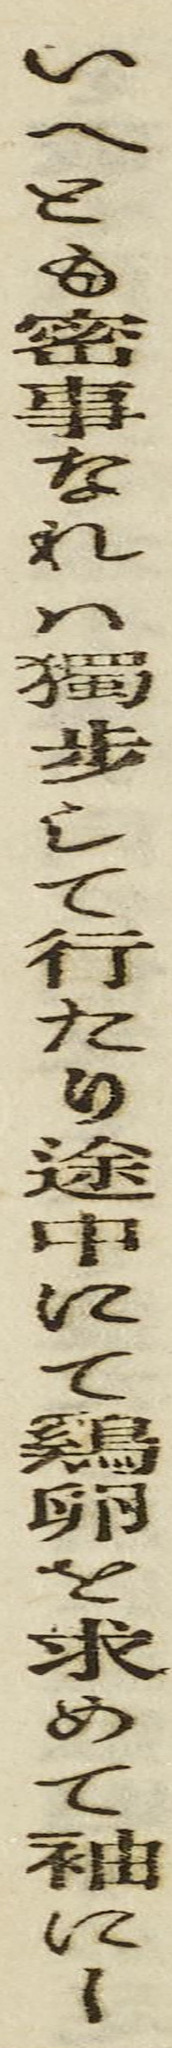いへとも密事なれハ独歩して行たり途中にて鶏卵を求めて袖にし
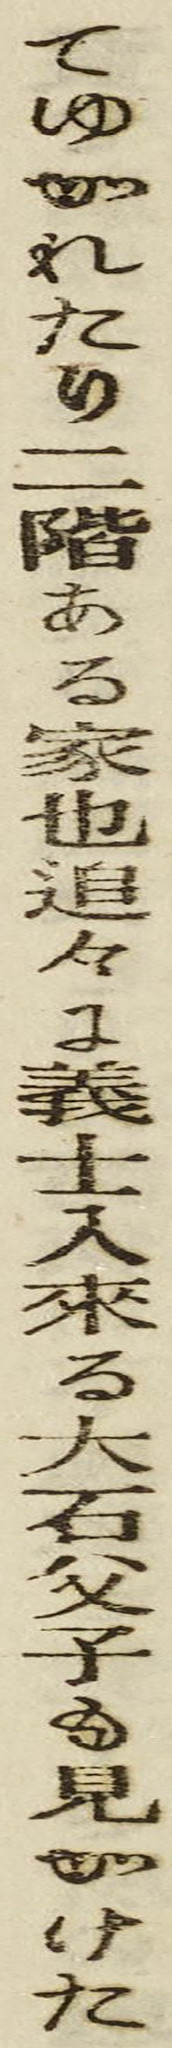てゆかれたり二階ある家也追々に義士入来る大石父子も見かけた
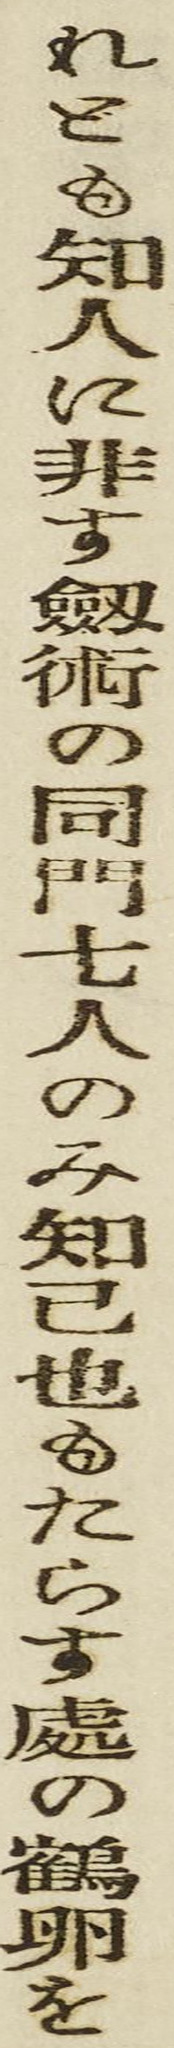れとも知人に非す剣術の同門七人のみ知己也もたらす処の鶴卵を
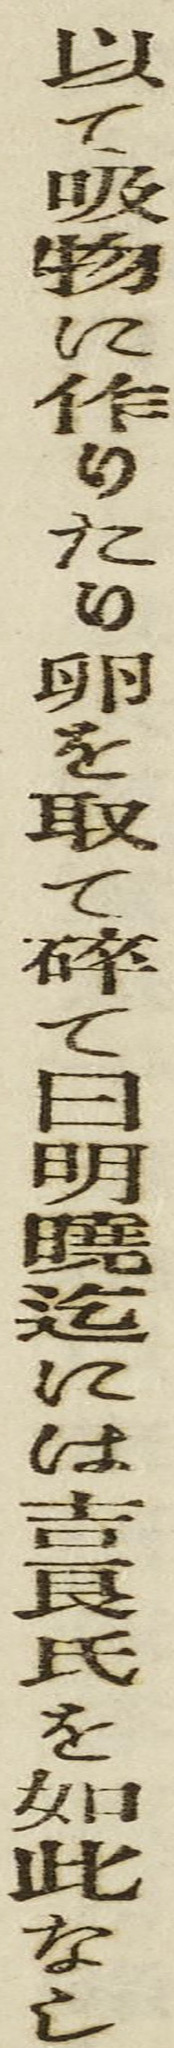以て吸物に作りたり卵を取て砕て曰明暁迄には吉良氏を如此なし
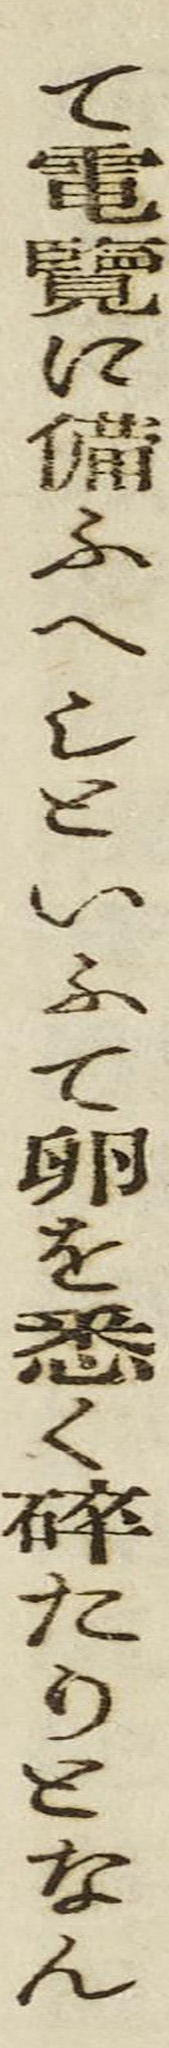て電覧に備ふへしといふて卵を悉く砕たりとなん
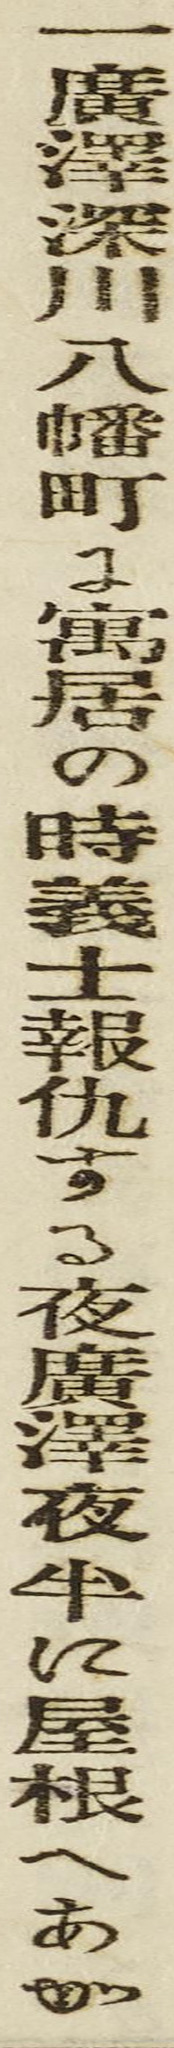一広沢深川八幡町に寓居の時義士報仇する夜広沢夜半に屋根へあか
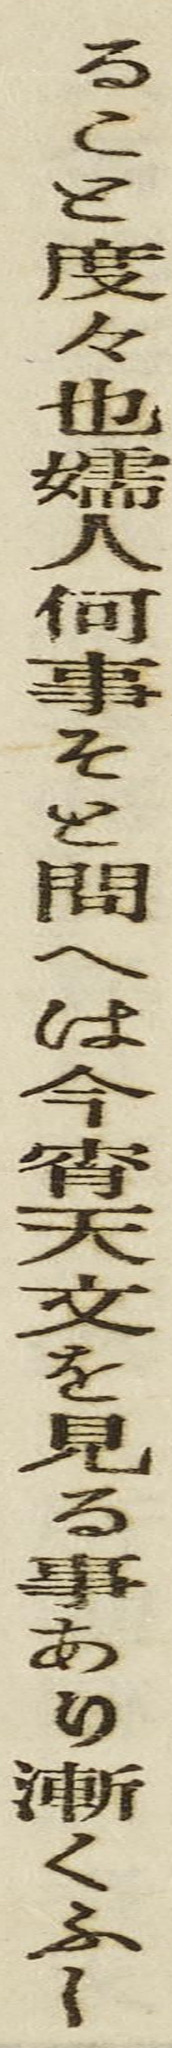ること度々也嬬人何事そと問へは今宵天文を見る事あり漸くふし
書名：史籍集覽　朝鮮陣古文・細井廣澤記・颶風紀事・天明七年將軍宣下次第書　全
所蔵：東京大学地震研究所図書室 Earthquake Research Institute Library, The University of Tokyo, JAPAN
